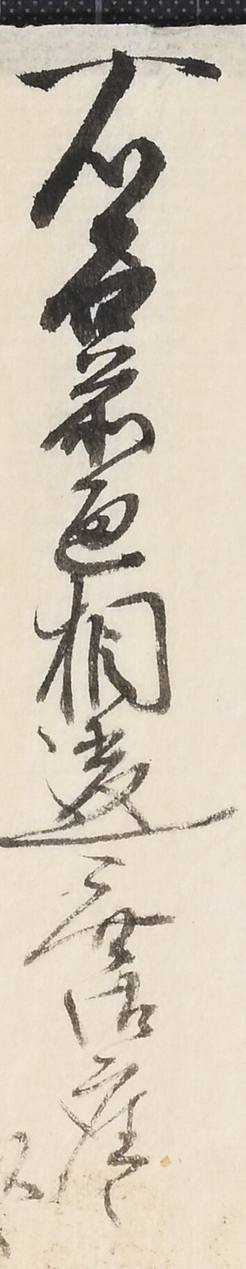右名前通相違無御座候
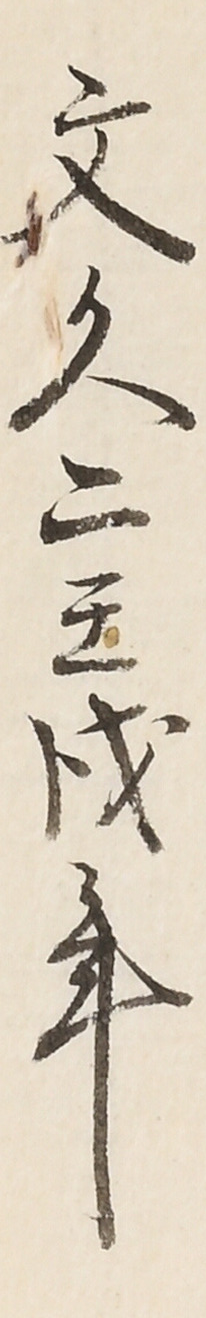文久二壬戌年
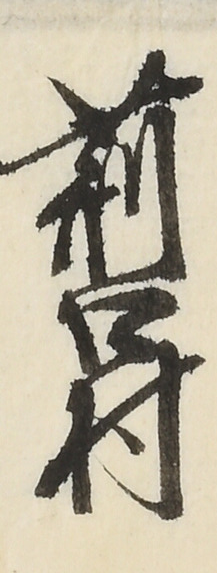荊口村
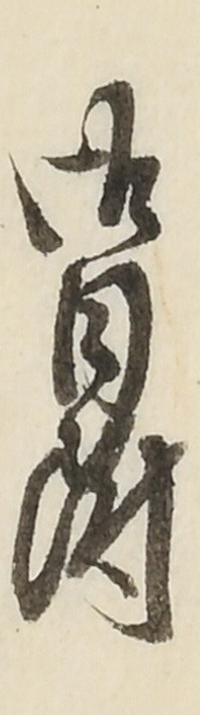御目附
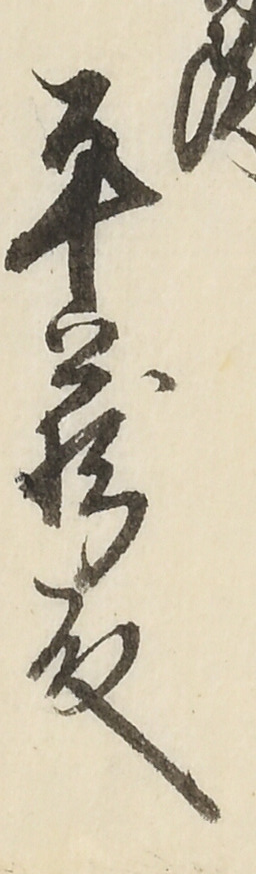平蔵殿
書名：文久二壬戌年正月他国石切名前書上帳
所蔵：伊那市立高遠町図書館・合同会社AMANE
